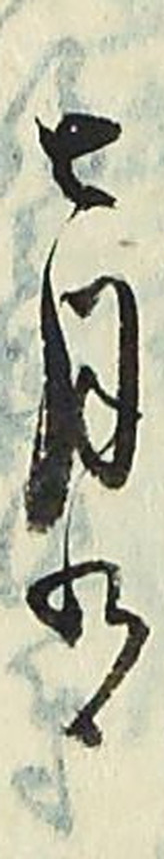七月九日
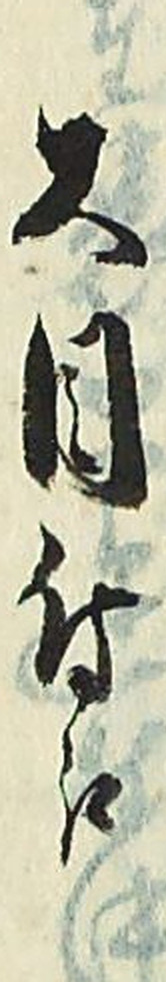大目付江
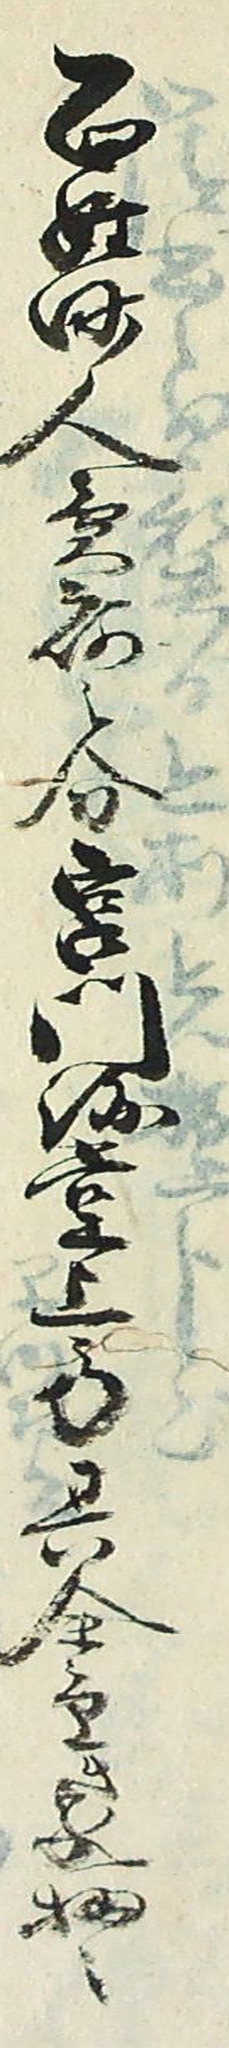百姓町人売荷之分宮門跡堂上方其余重き家柄之
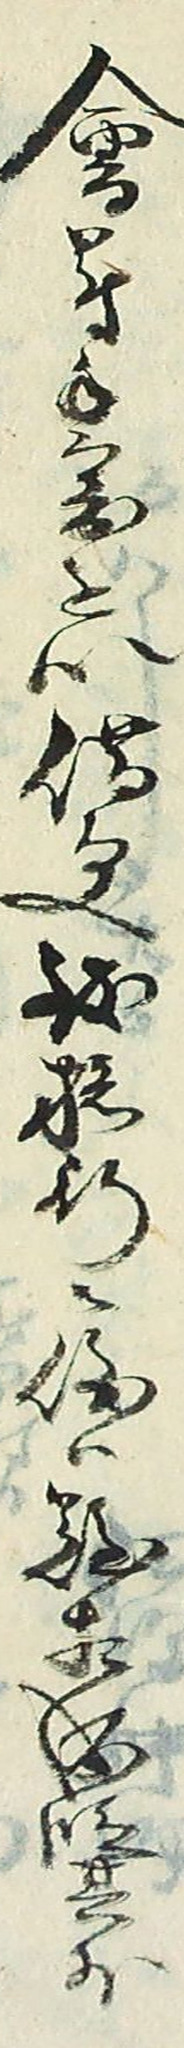会符手寄を以借受致旅行候儀は難相成段其外
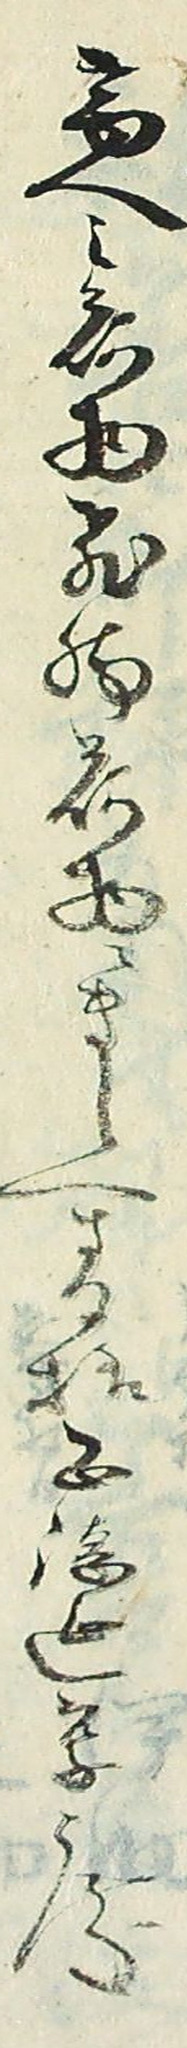商人之荷物飛脚荷物にましへさる様正徳延享度
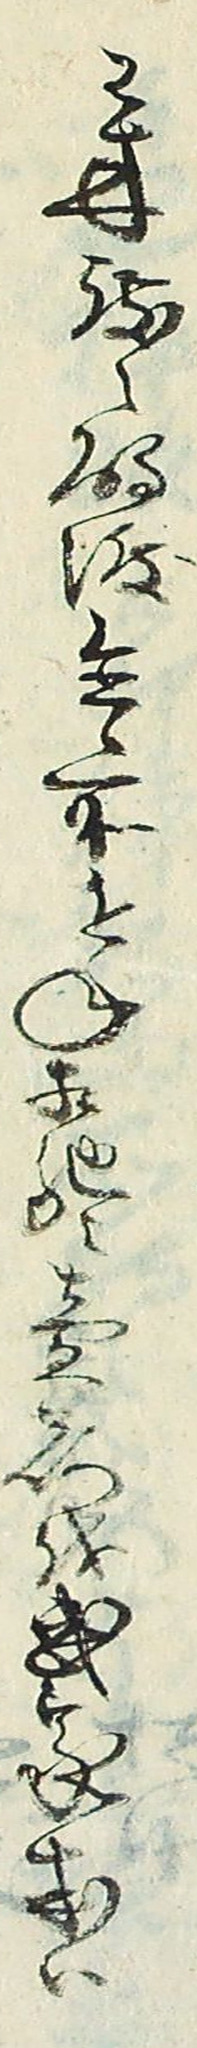已来度々触渡置候所近年相弛み売荷を武家或は
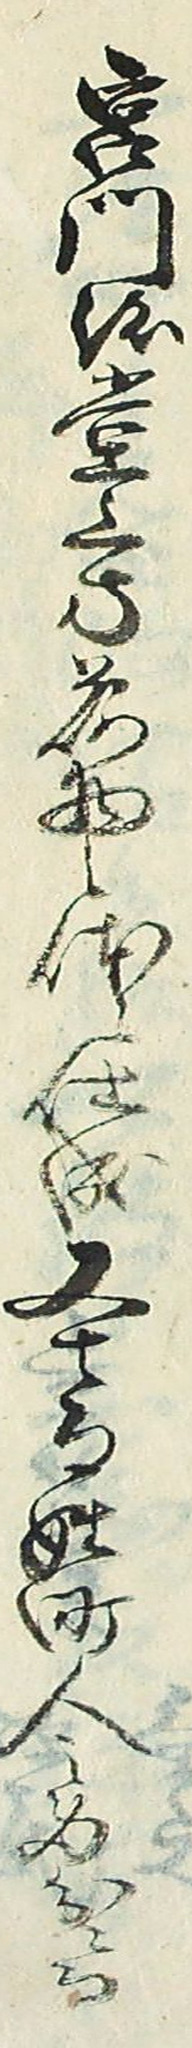宮門跡堂上方荷物之体に仕成又は百姓町人之身分に而
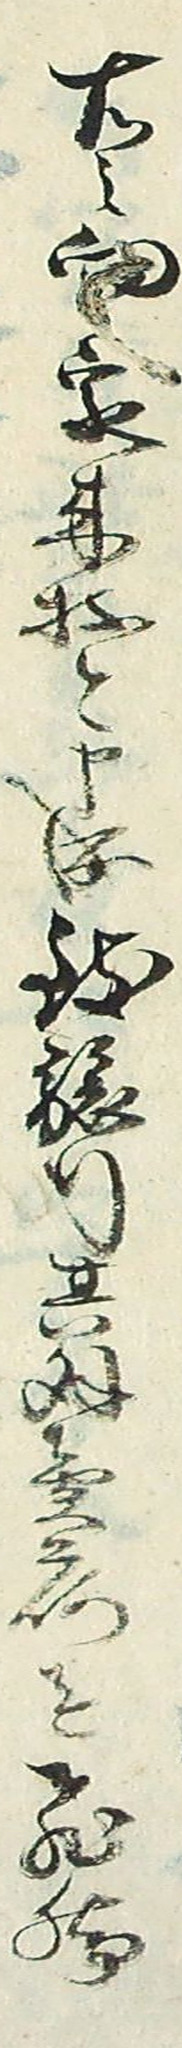右之向家来抔と申成致旅行其外売荷を飛脚
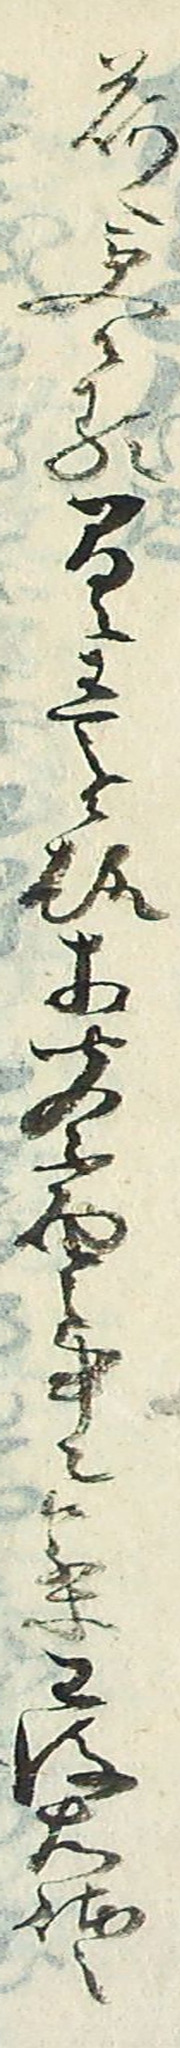荷へ受候類間々有之候趣相聞不届之事に候条已後右体之
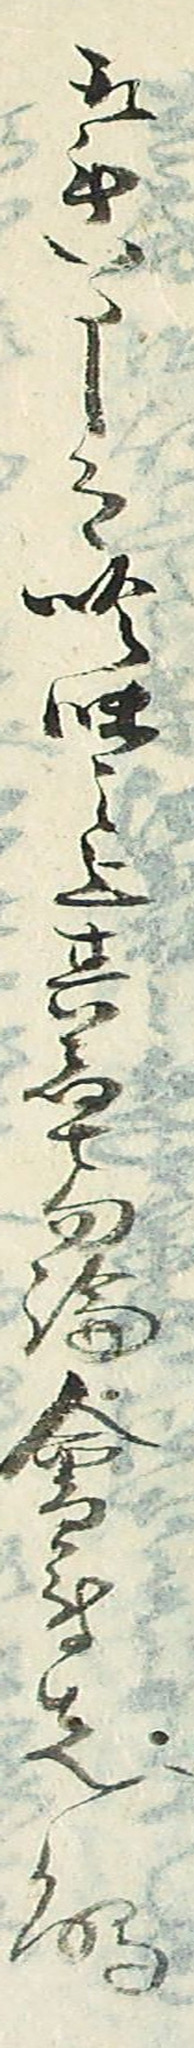取計致し候はゝ吟味之上其者は勿論会符先触
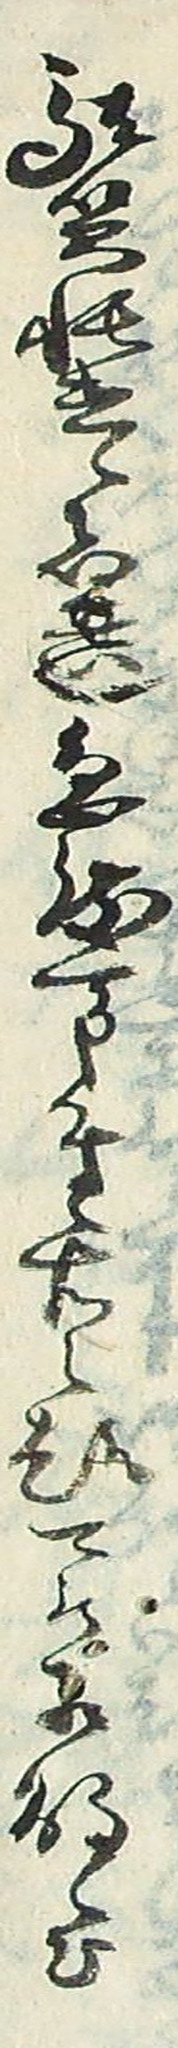駄賃帳遣候者共急度可申付候右之趣可被相触候

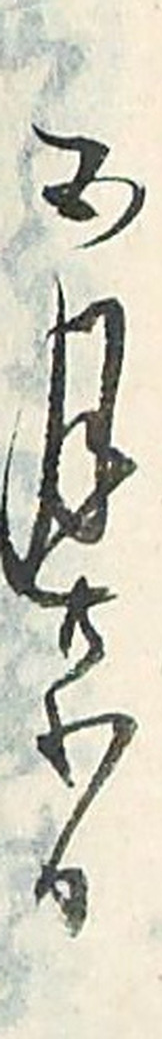五月廿五日
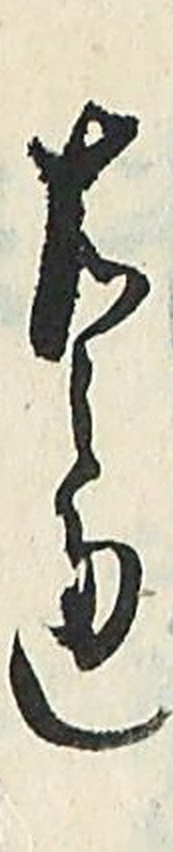右之通
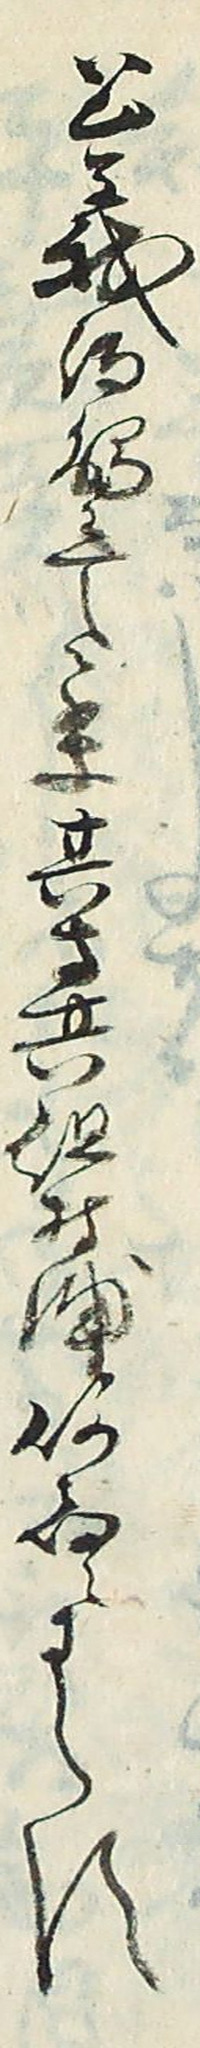公義御触有之候条其方共組村浦何者によらす
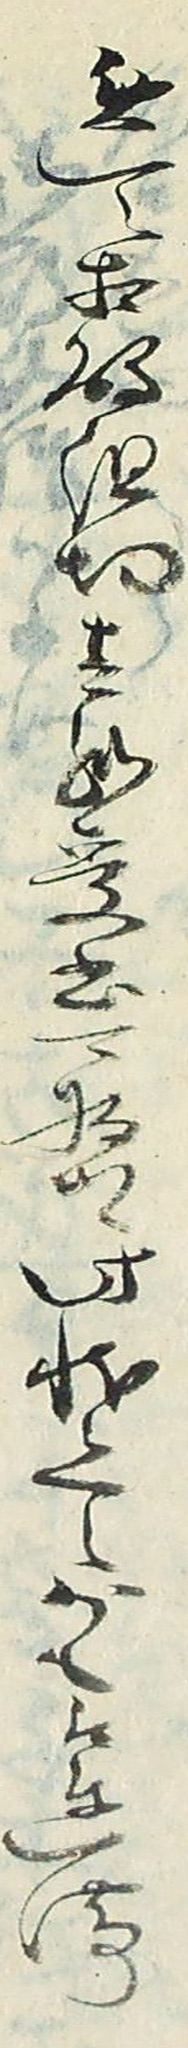逸々相触組切壱紙受書可指出候此状先々少も無遅滞
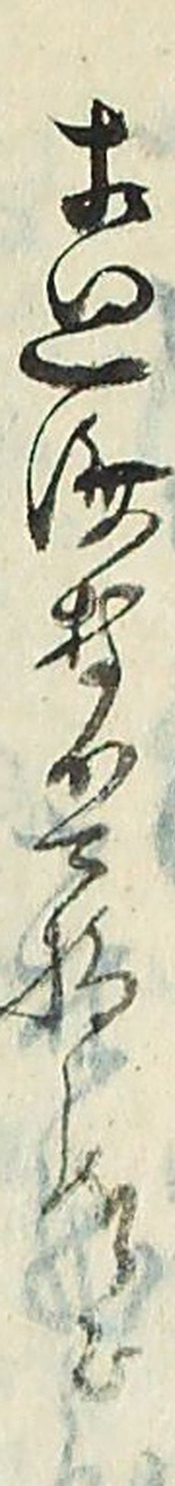相廻済村ゟ可指戻候以上
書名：諸御用御□受書控
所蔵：鳴門教育大学 Naruto University of Education
